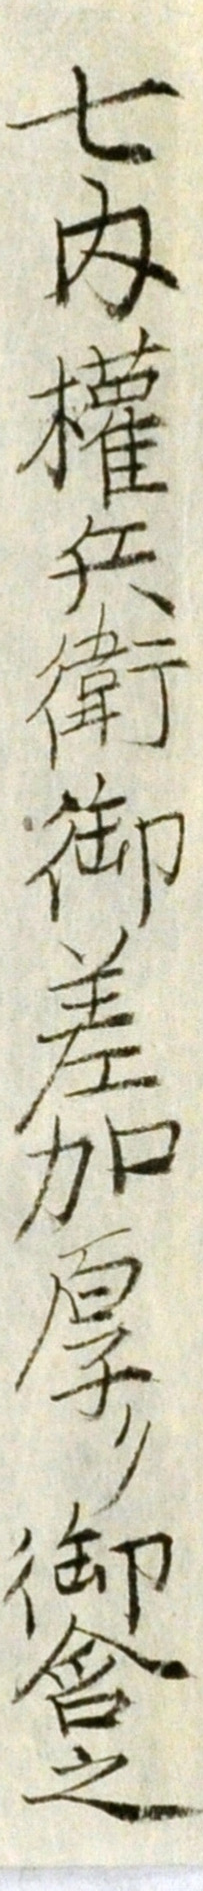七内権兵衛御差加厚ク御含之
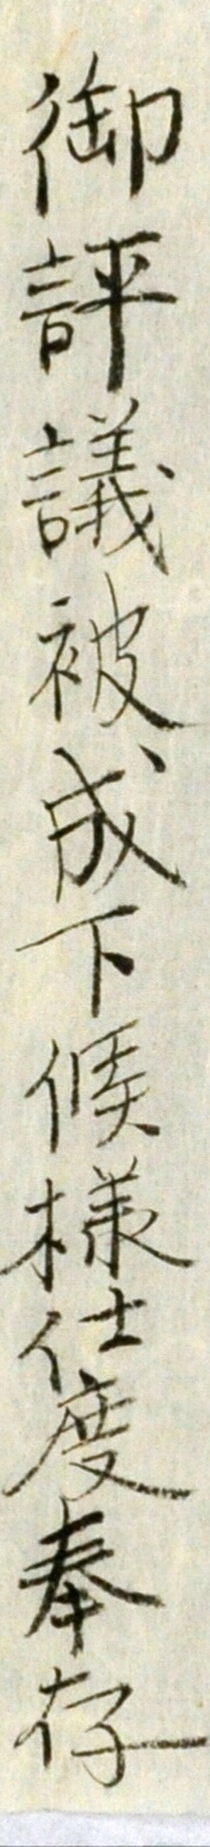御評議被成下候様仕度奉存
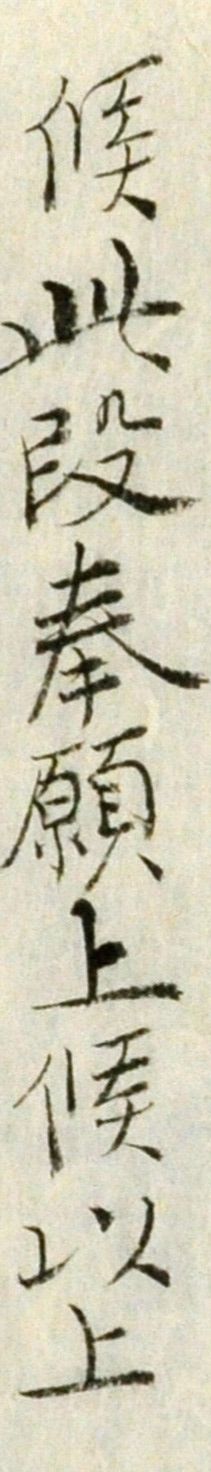候此段奉願上候以上

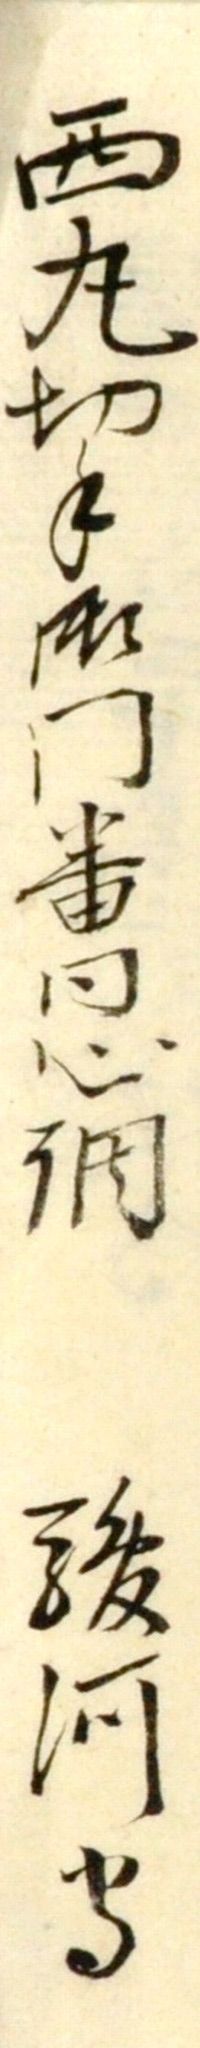西丸切手御門番同心調駿河守

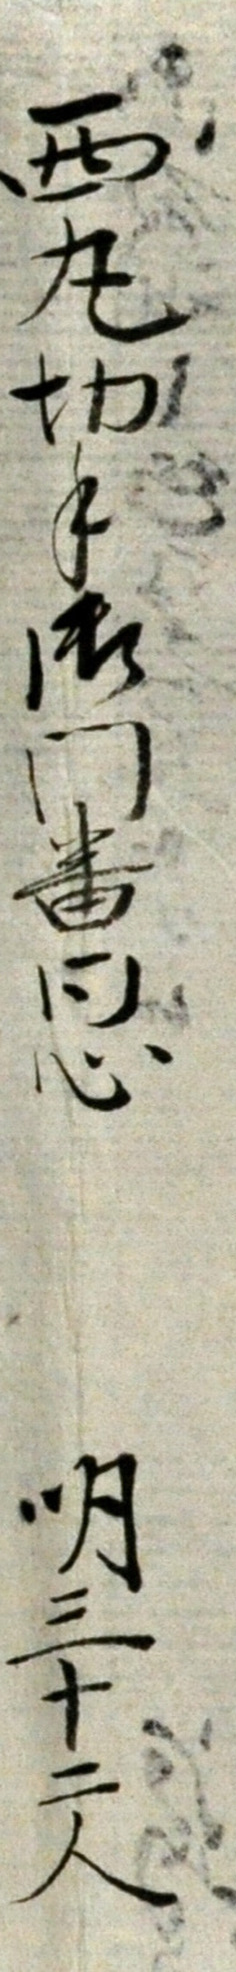西丸切手御門番同心明三十二人
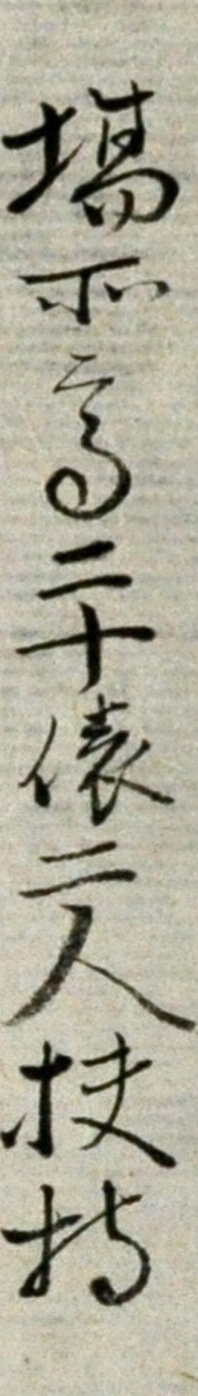場所高二十俵二人扶持
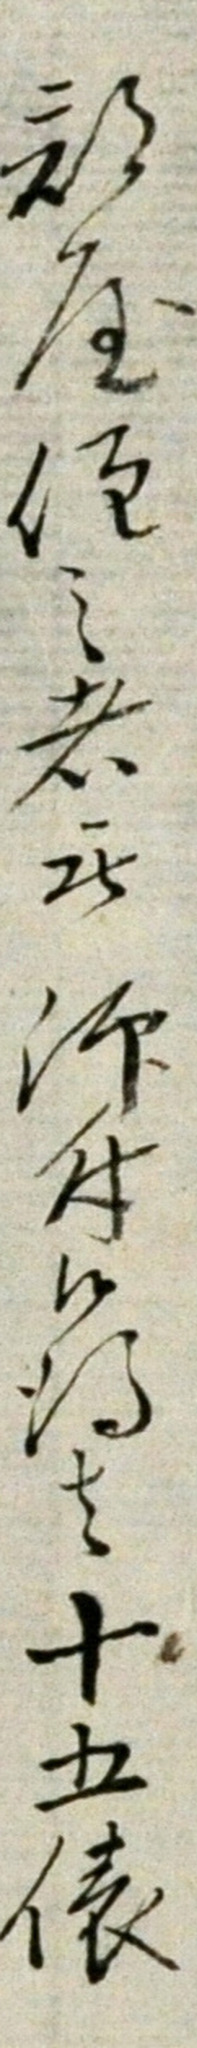部屋住之者被仰付候得者十五俵
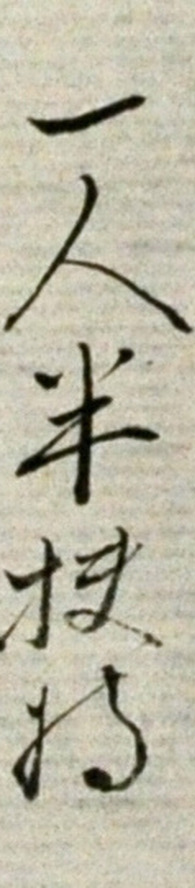一人半扶持
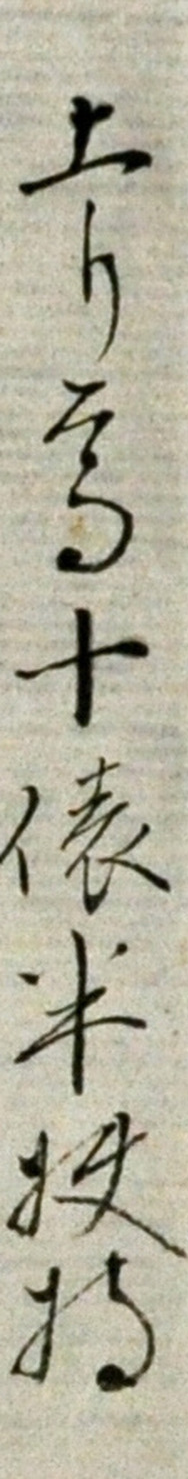上リ高十俵半扶持
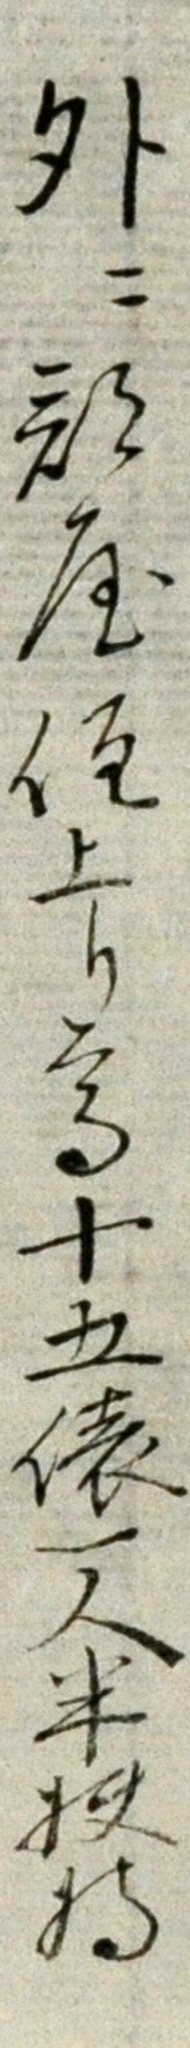外ニ部屋住上リ高十五俵一人半扶持
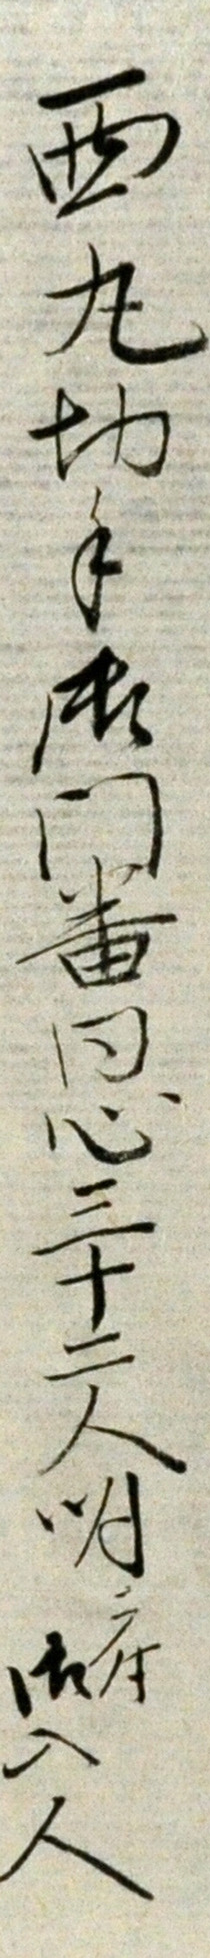西丸切手御門番同心三十二人明ニ付御入人
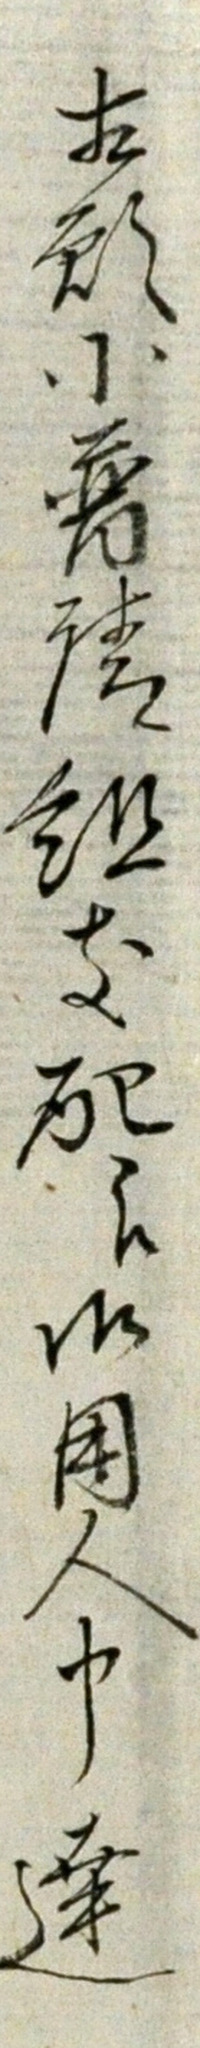相頼小普請組支配江御用人申達
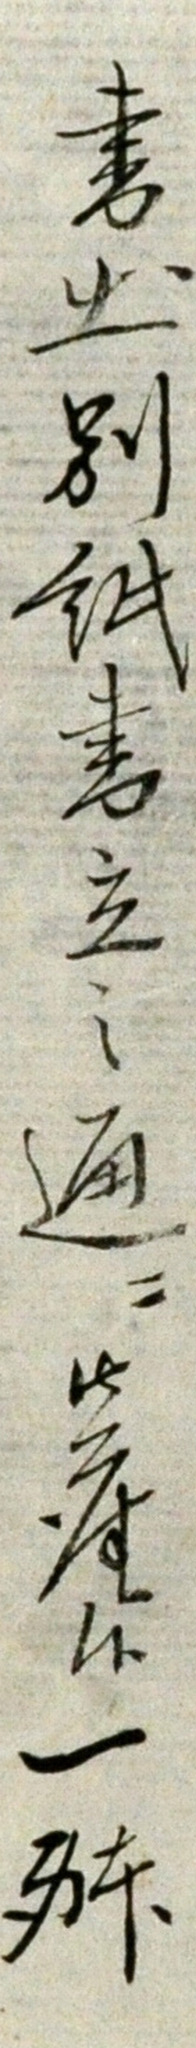書上別紙書立之通ニ御座候一躰
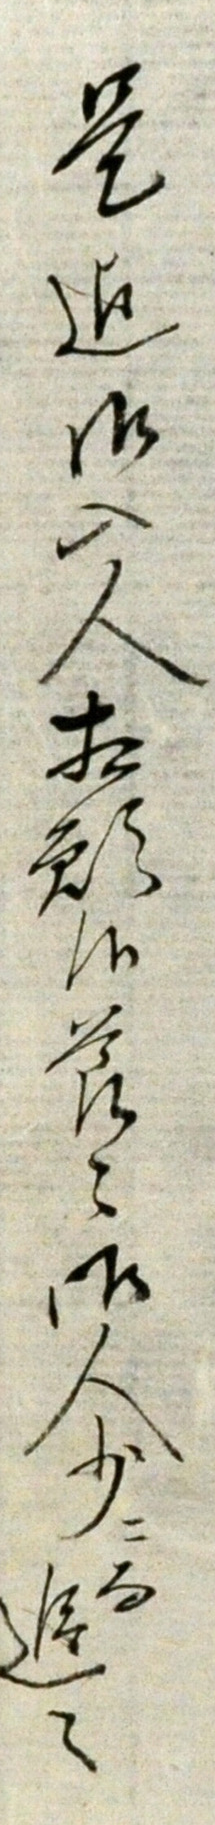是迄御入人相頼候節ニ御人少ニ而追々
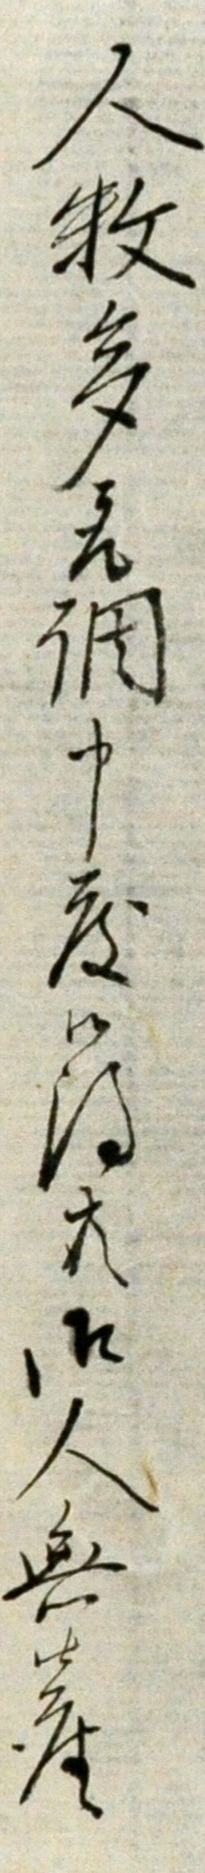人数多ニ取調申度候得共御人無御座

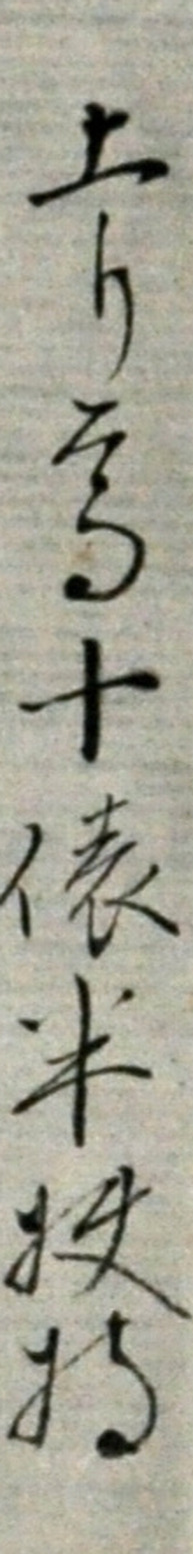上リ高十俵半扶持
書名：若年寄御役中御調書付
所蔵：伊那市立高遠町図書館・合同会社AMANE
